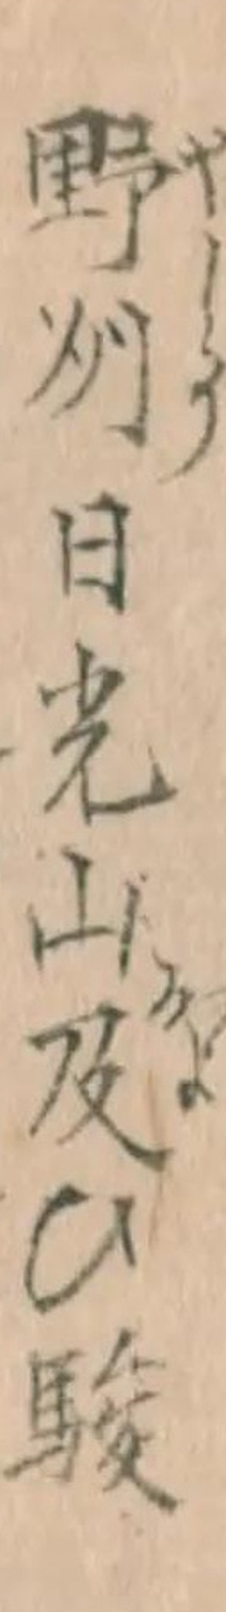野州日光山及ひ駿
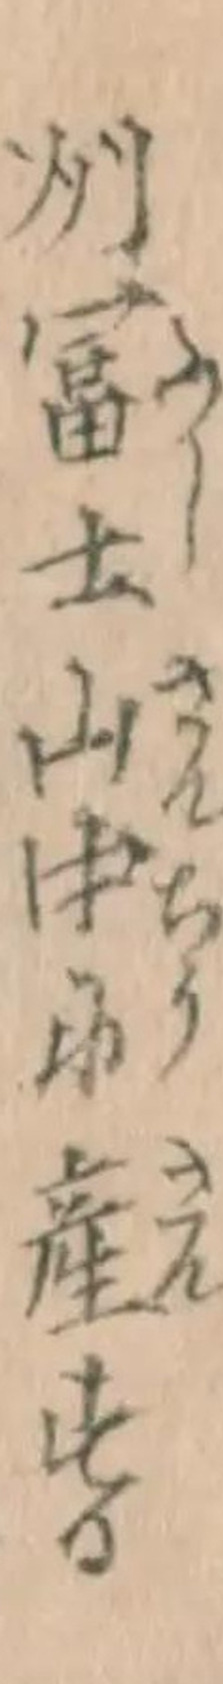州富士山中に産する
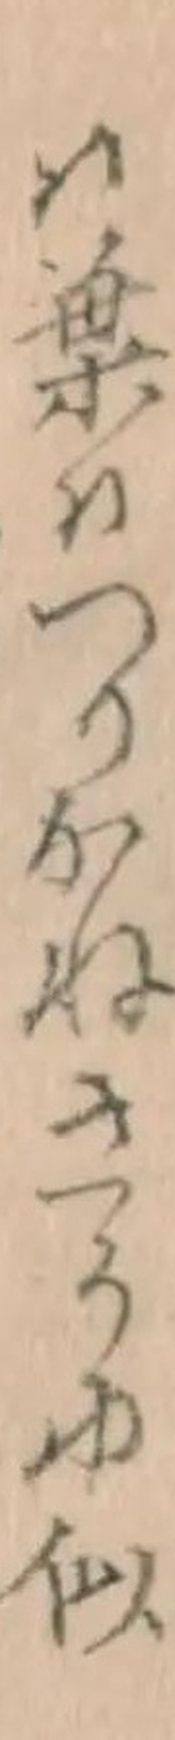は葉はつりかねさうに似
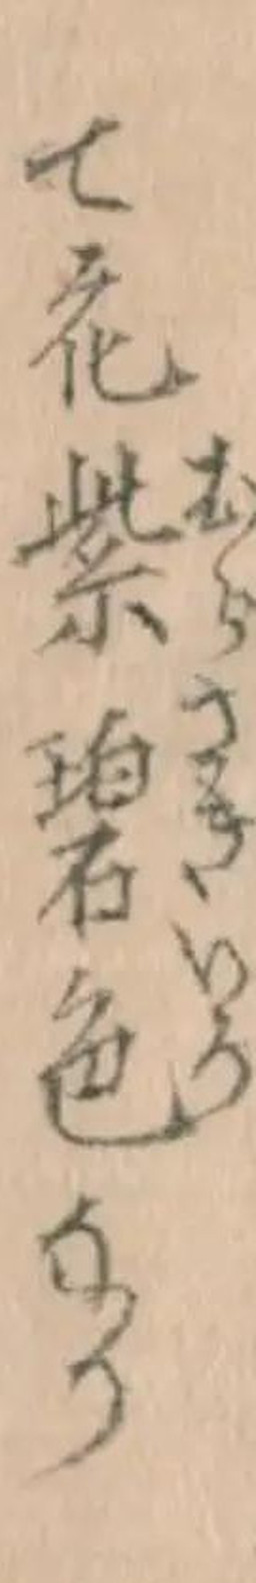て花紫碧色なり
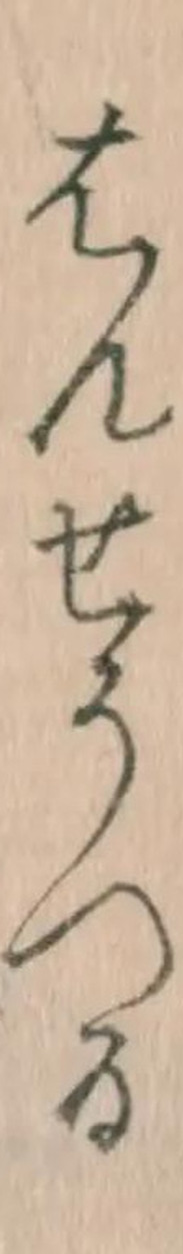はんせうつる
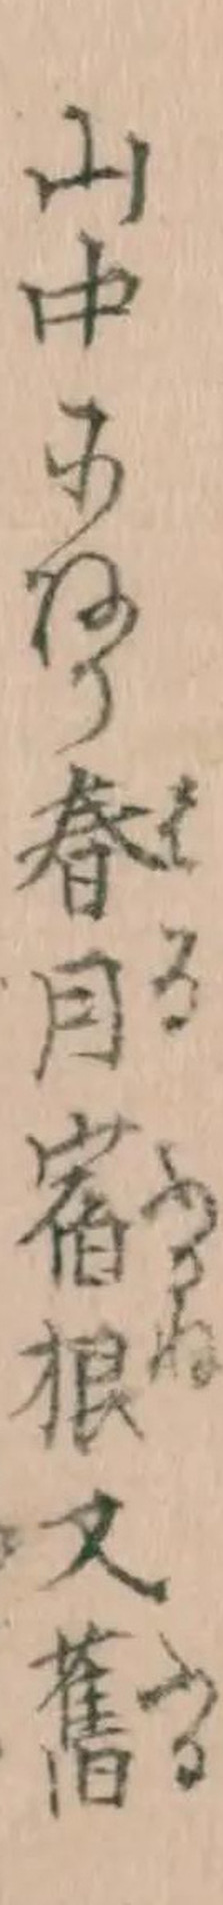山中にあり春月宿根又旧
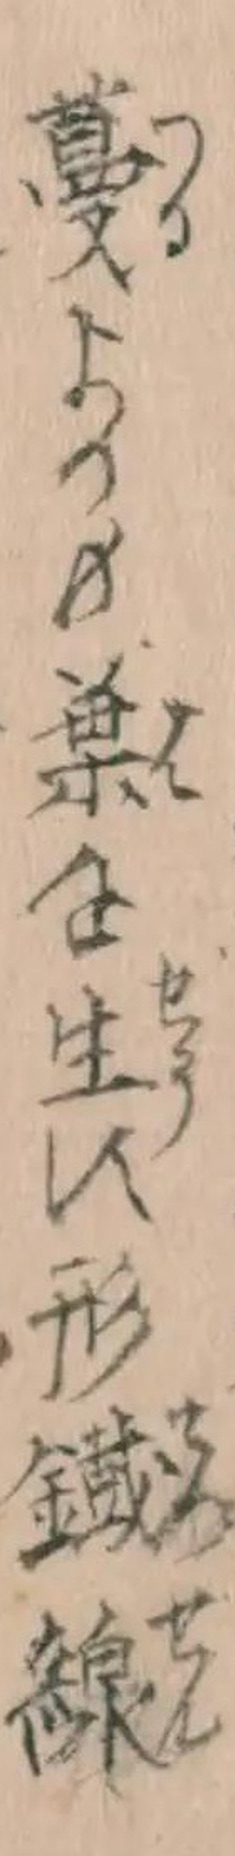蔓よりも葉を生す形鉄線
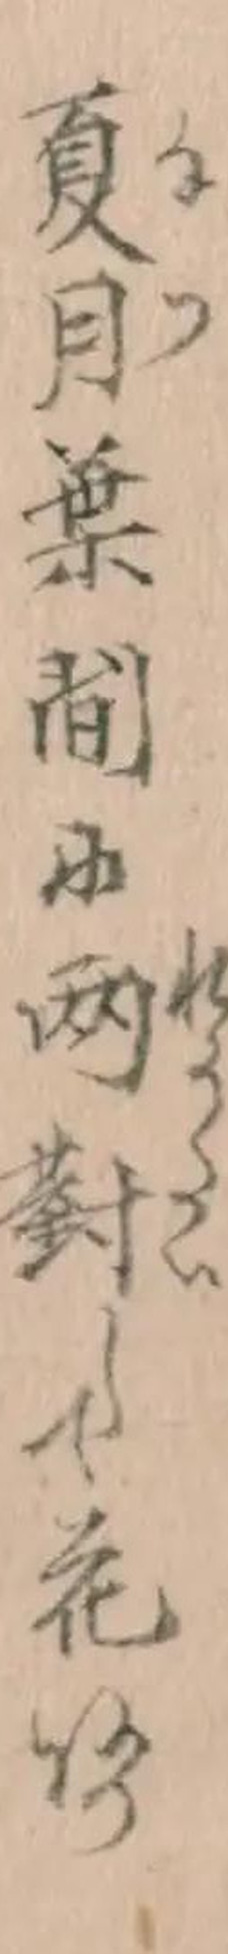夏月葉間に両対して花あり
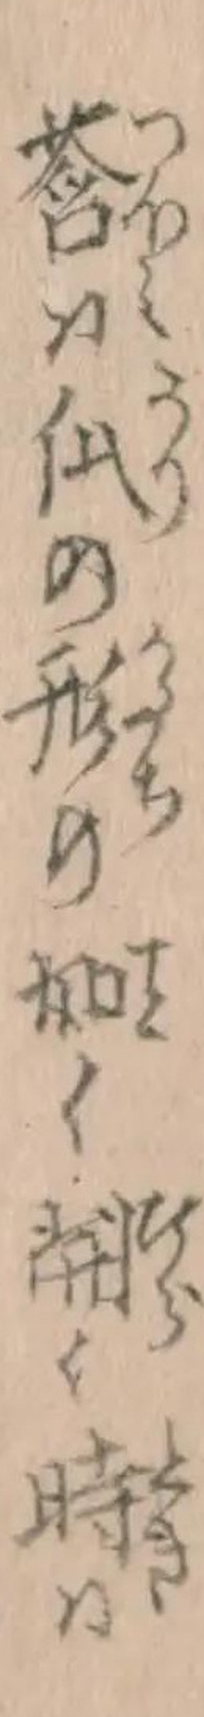莟は瓜の形の如く開く時は
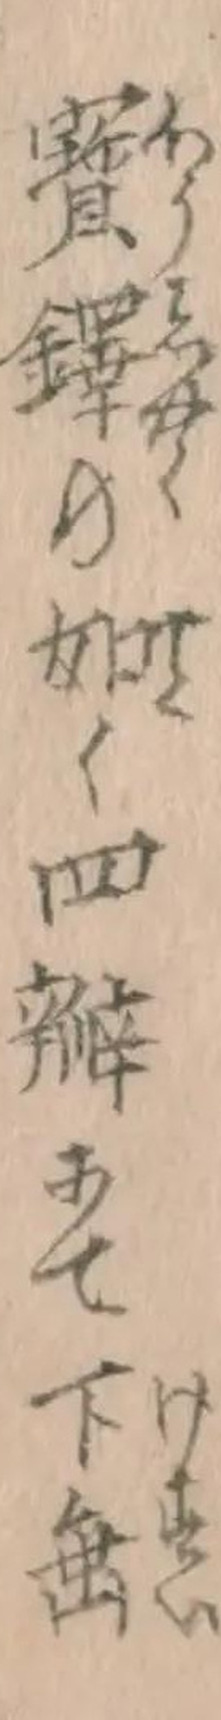宝鐸の如く四弁にて下垂
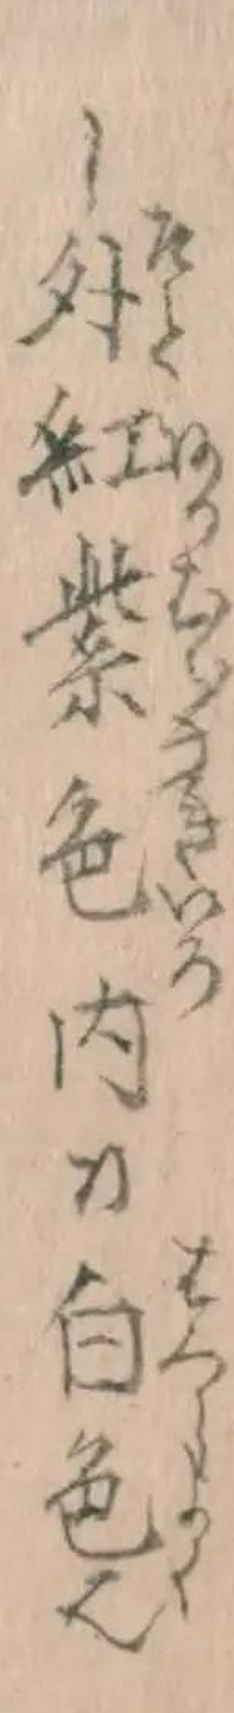し外紅紫色内は白色也
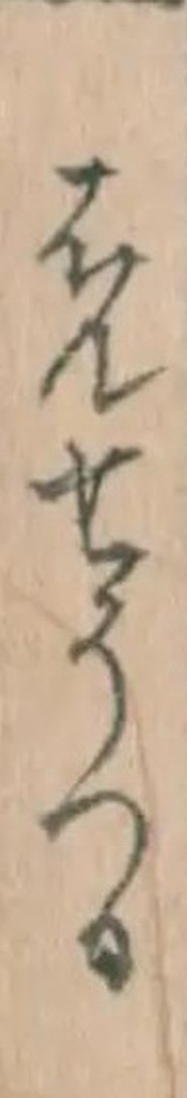はんせうつる

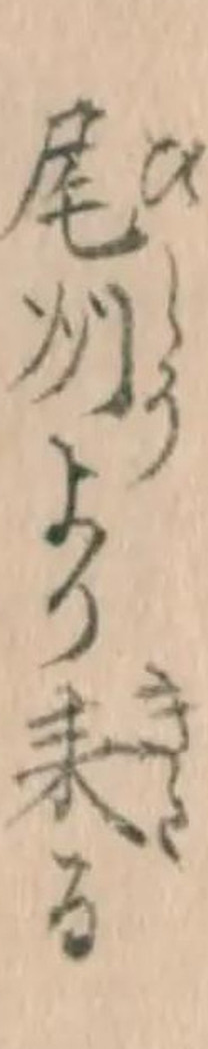尾州より来る
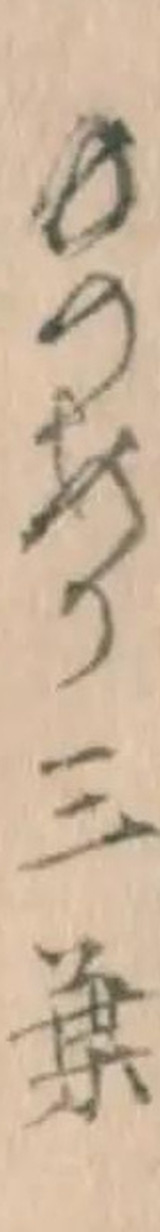ものあり三葉
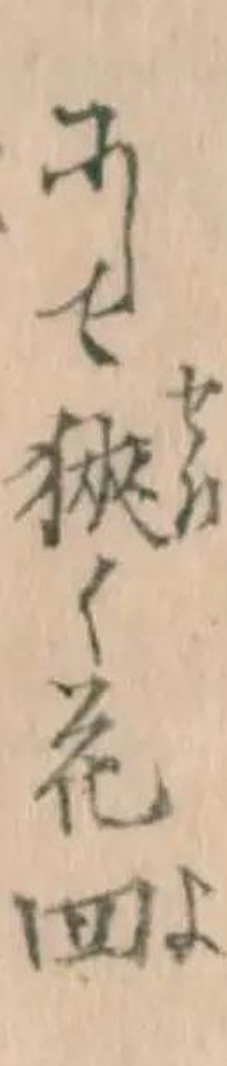にして狭く花四
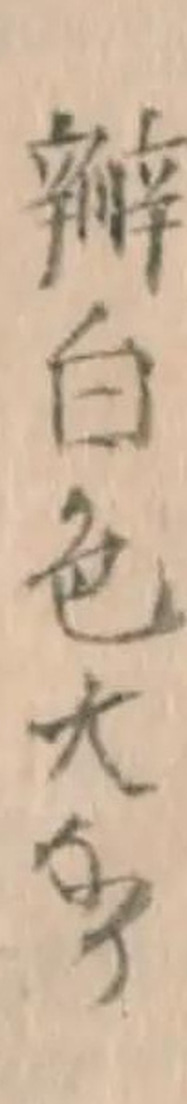弁白色大なり
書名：本草図譜. 巻28-30
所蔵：国立国会図書館 National Diet Library, JAPAN
